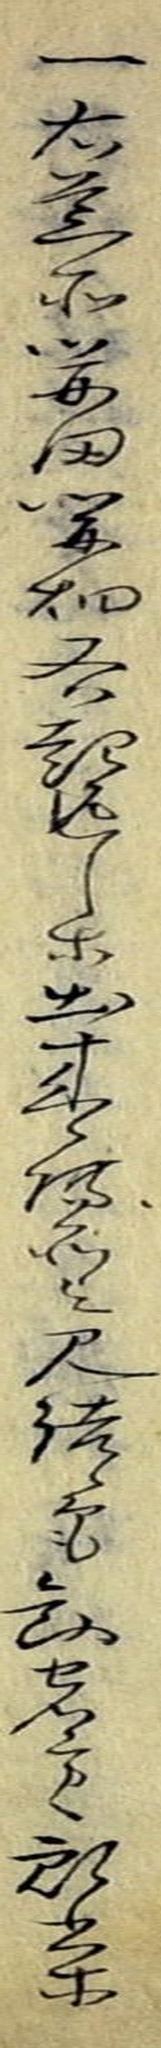一右荒所開田開畑又は起返し等出来候場所と見詰候而も勧農方へ願書等
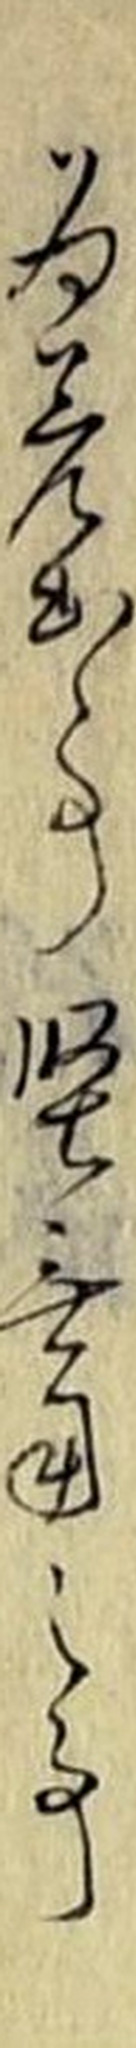為差出候事堅無用之事
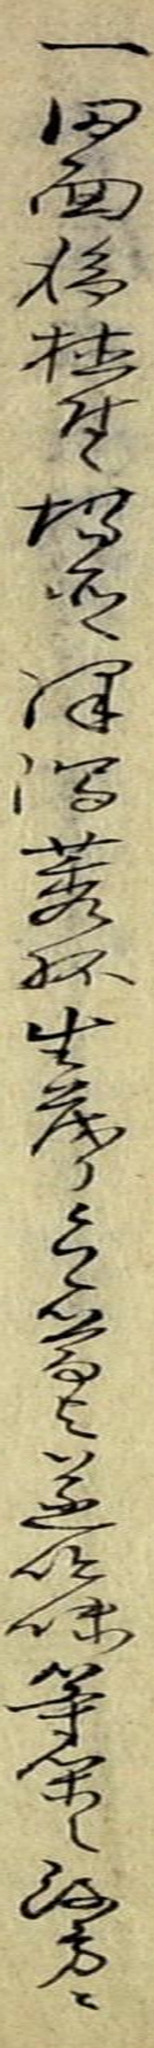一田畑稲植付候場所へ沢瀉菱抔生茂り候はヽ篤と遂吟味等閑之致方に
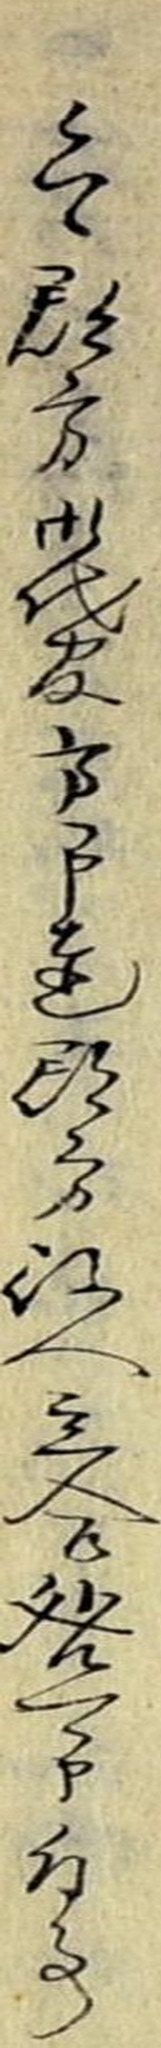候はヽ郡方御代官方へ申達郡方役人立合咎可申付事
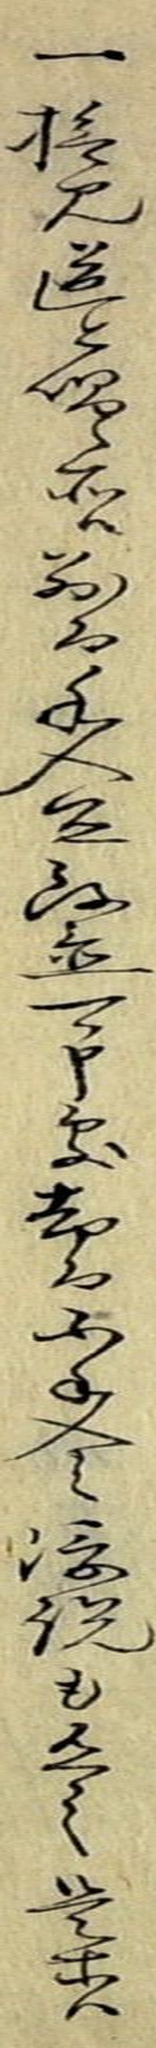一検見道と唱候所は別而手入宜致置可申処却而不手入之演説も有之是等は
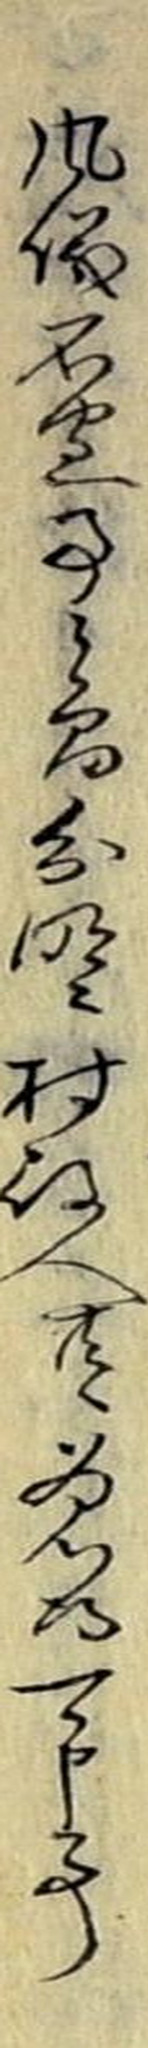風儀不宜事に候間分明に村役人共へ為心得可申事
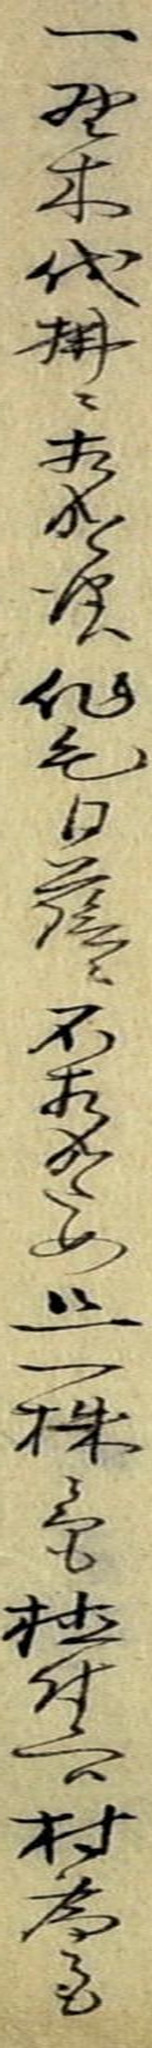一野木伐払に相成候儀は作毛日蔭に不相成ため且一株に而も植付候へは村為にも
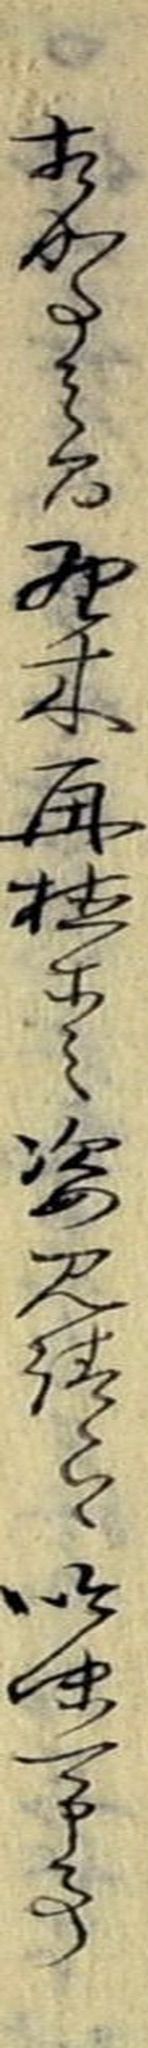相成事に候間野木再植等之姿見請候はヽ吟味可申事
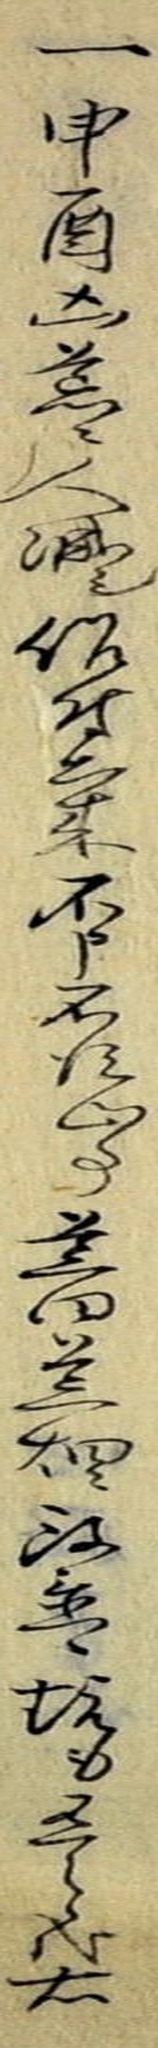一申酉凶荒に人減し作付出来不申不得止事荒田荒畑に致置候趣も有之哉右
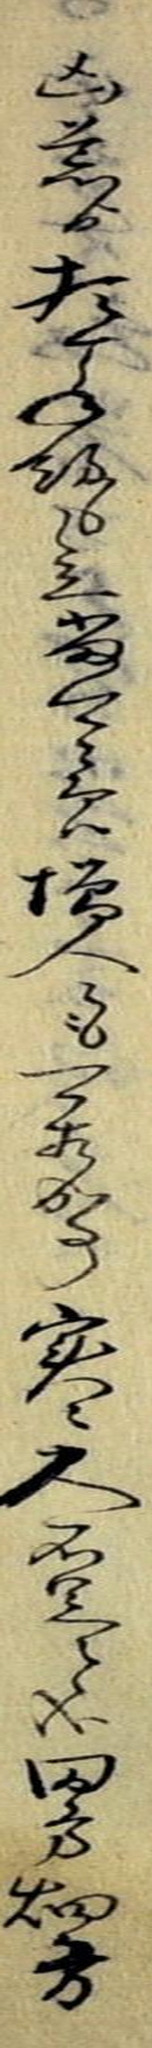凶荒ゟ拾ヶ年餘も立当今に而は増人にも可相成事実々に人不足候哉田方畑方
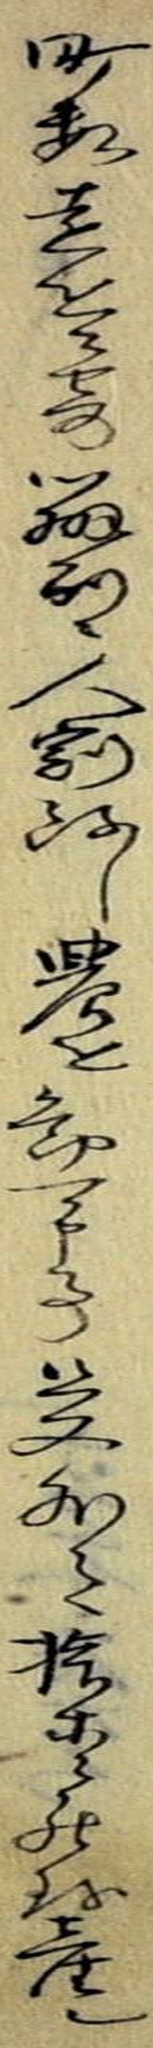町数遠近に寄弁別に人割致し農を勤可申事且又外々へ桛等に罷越産れ
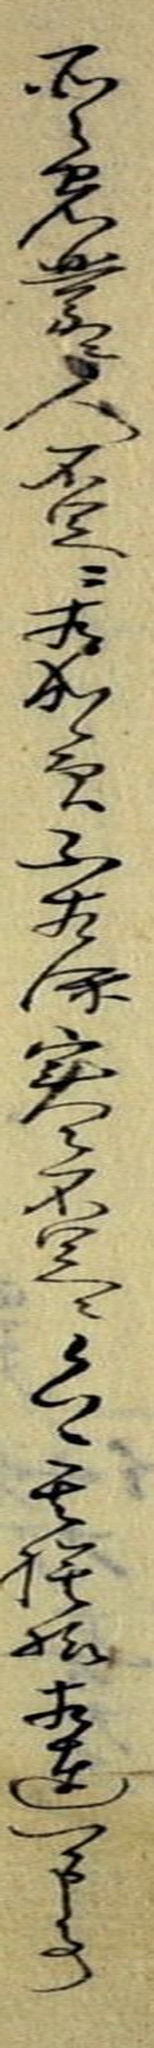所之農業に人不足に相成候而は不相済実々不足に候はヽ其模様相達可申事
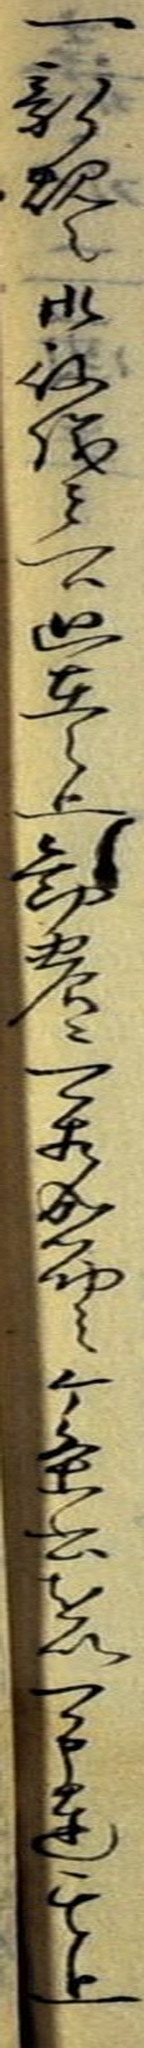一新規之御役儀に候へは廻在候上勧農に可相成之筋之ヶ条書を以可申達其上
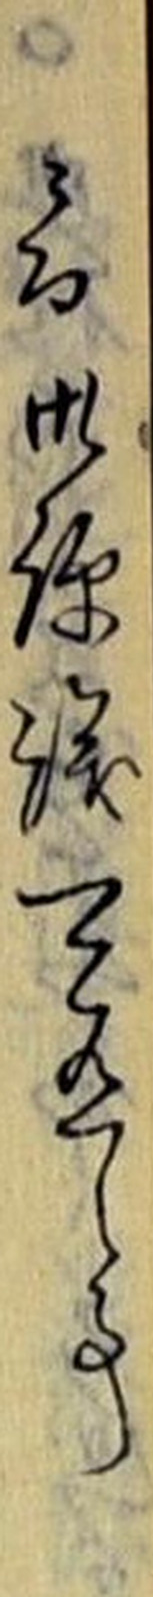に而御評議可有之事
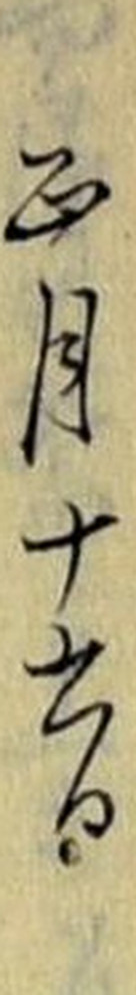正月十六日
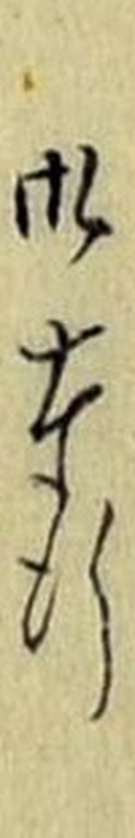御奉行
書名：命令之部 六
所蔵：福井県文書館 Fukui Prefectural Archives
